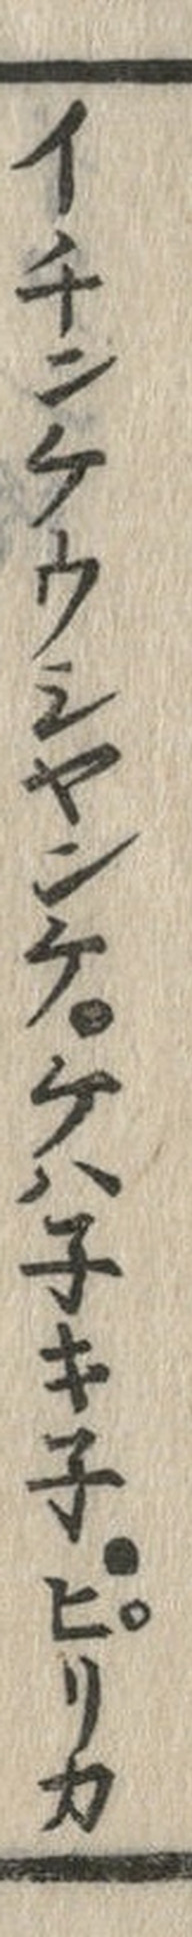イチンケウシヤンケ。ケハネキネ。ピリカ
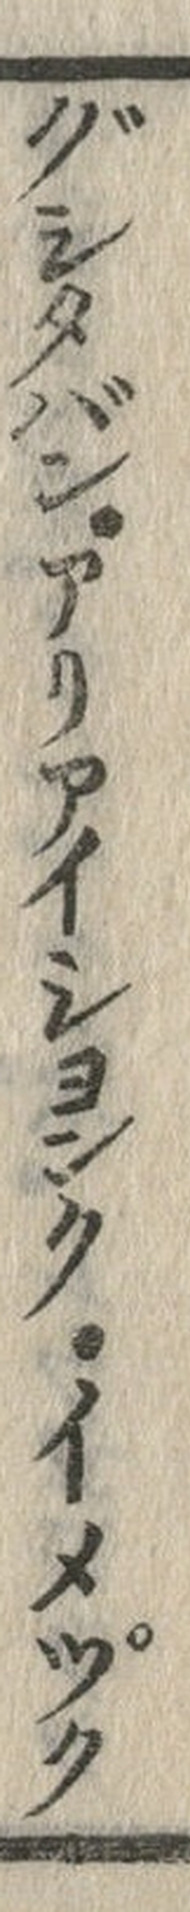グシタバン。アリアイシヨンク。イメツ゚ク
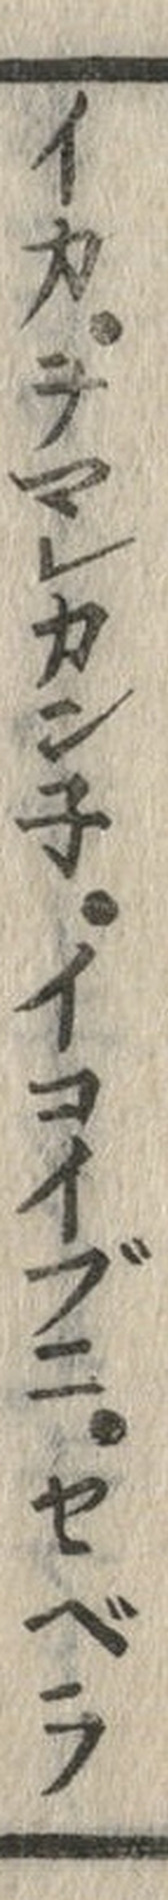イカ。ヲマレカンネ。イコイブニ。セベラ
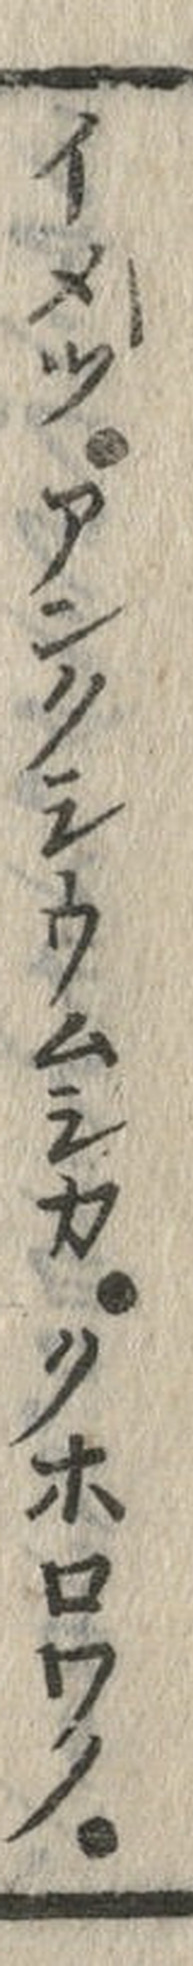イメツ。アンクシウムシカ。クホロワノ。

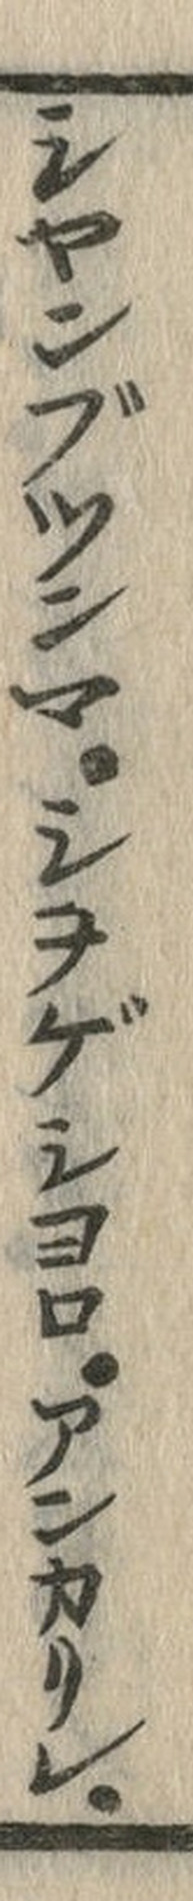シヤンブツンマ。シヲゲシヨロ。アンカリレ。
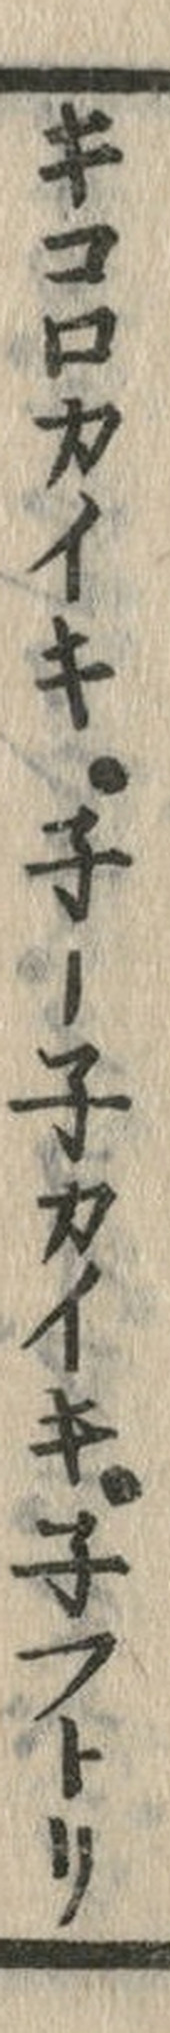キコロカイキ。ネーネカイキ。ネフトリ
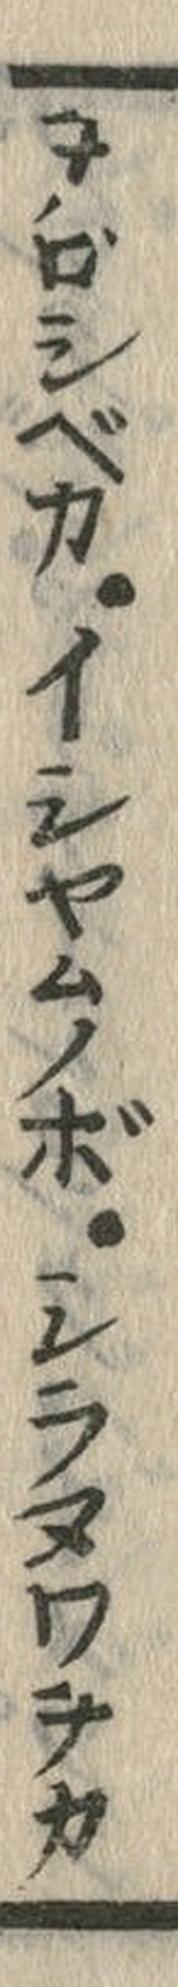ヲロシベカ。イシヤムノボ。シラヌワヲカ
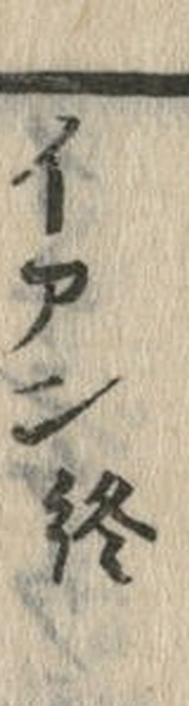イアン終
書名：蝦夷方言藻汐草　坤巻
